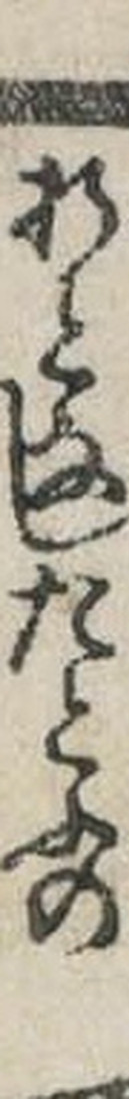折となしたとふの
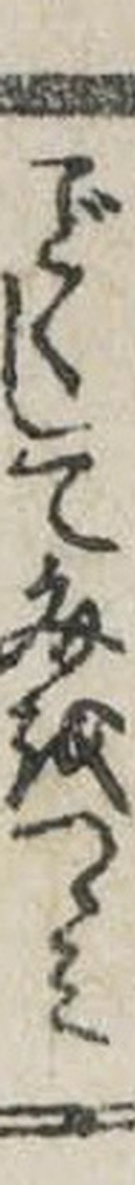ごとくして文をつゝみ
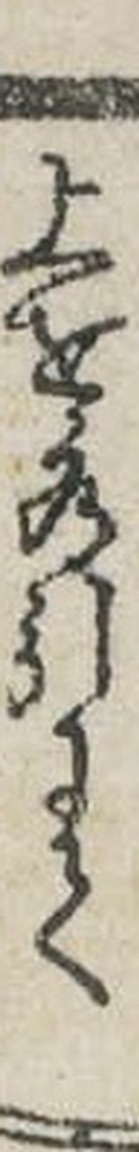上を水引にて
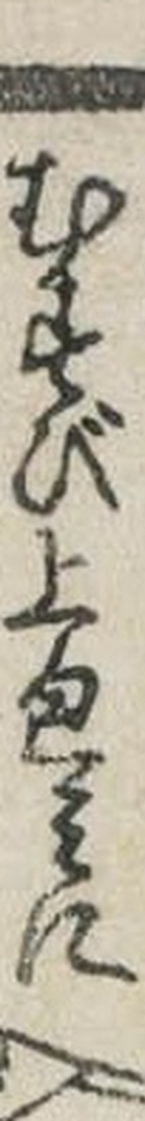むすび上包みに
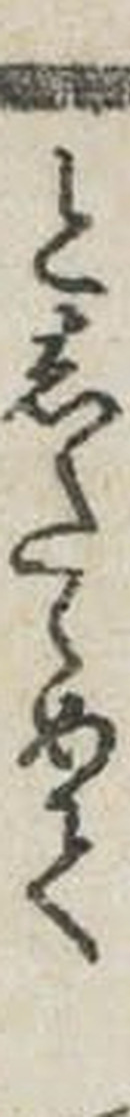としたゝめて
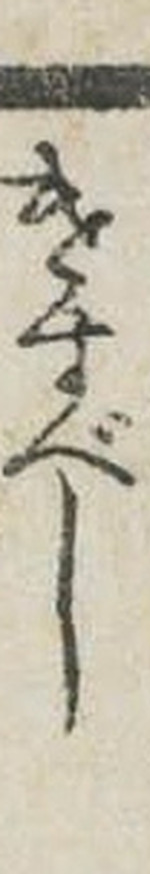遣すべし
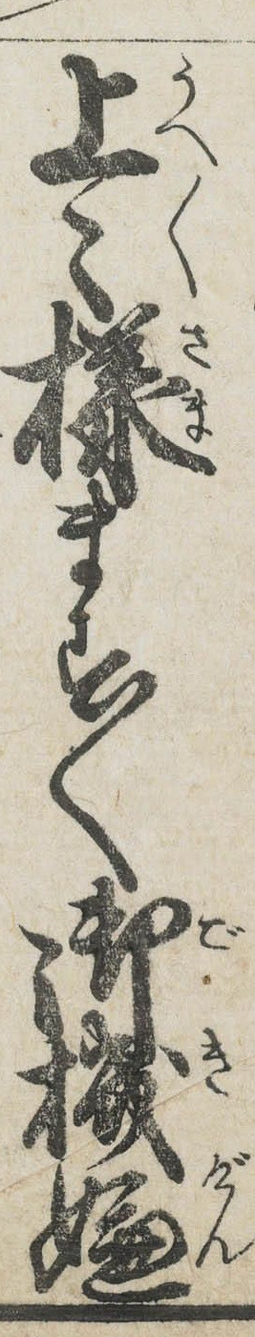上々様ます〳〵御機嫌
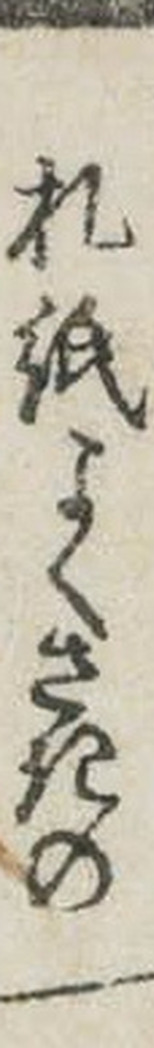札紙よくさきの
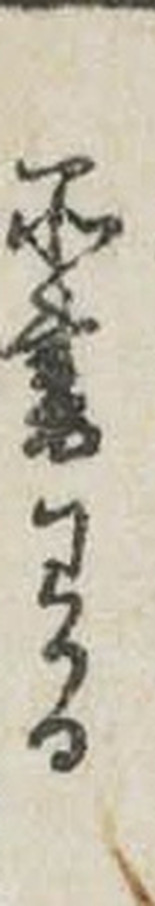所書わかる
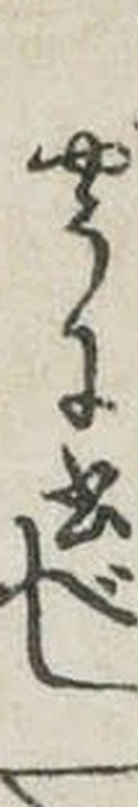やうに書べし
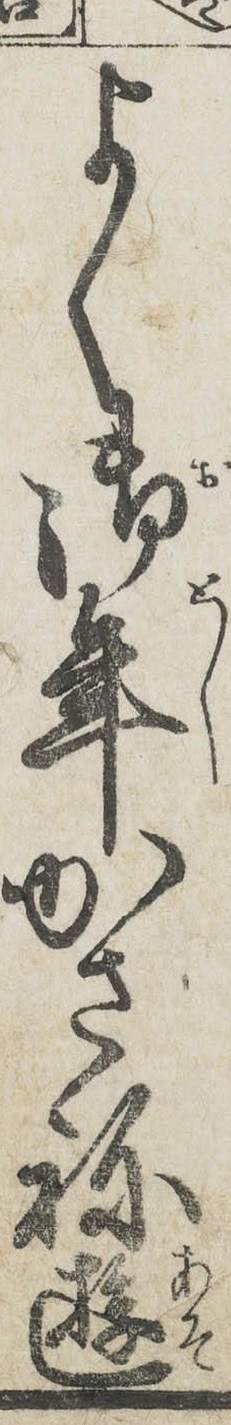よく御年かさね遊
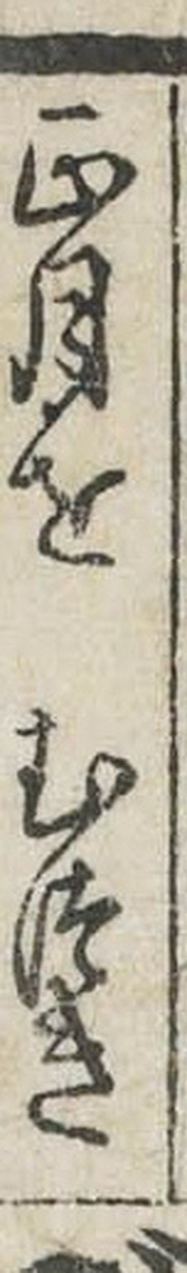正月をむつき
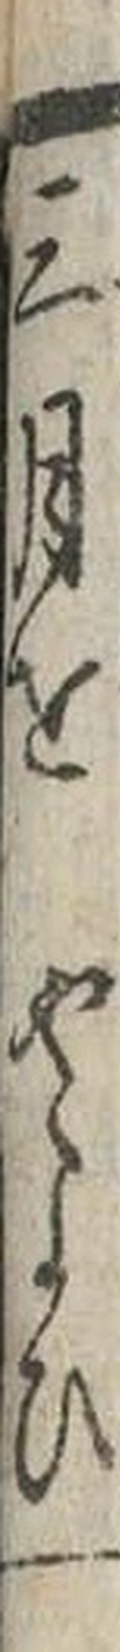三月をやよひ
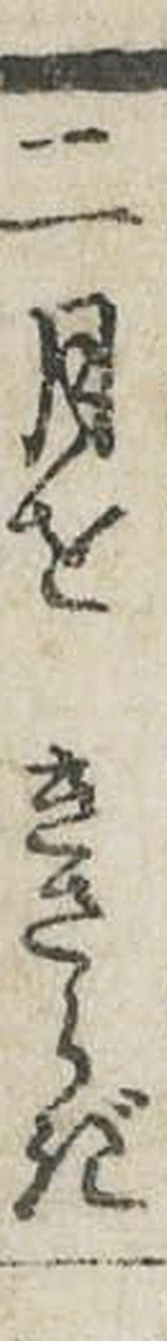二月をきさらぎ
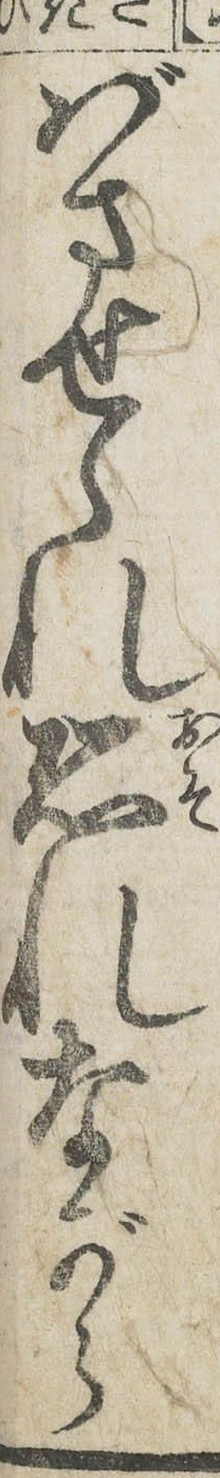ばさせられ恐れながら
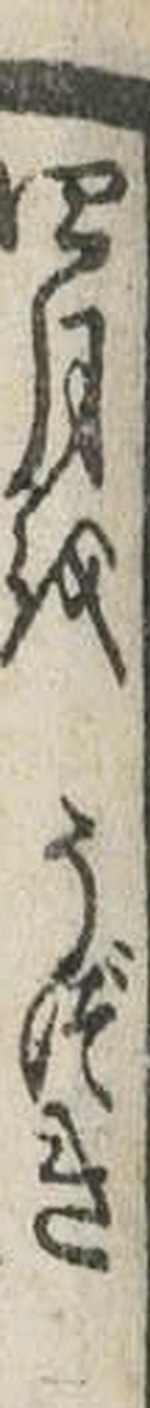四月をうづき
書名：頭書萬用婦人手紙之文言
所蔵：東京学芸大学教育コンテンツアーカイブ
